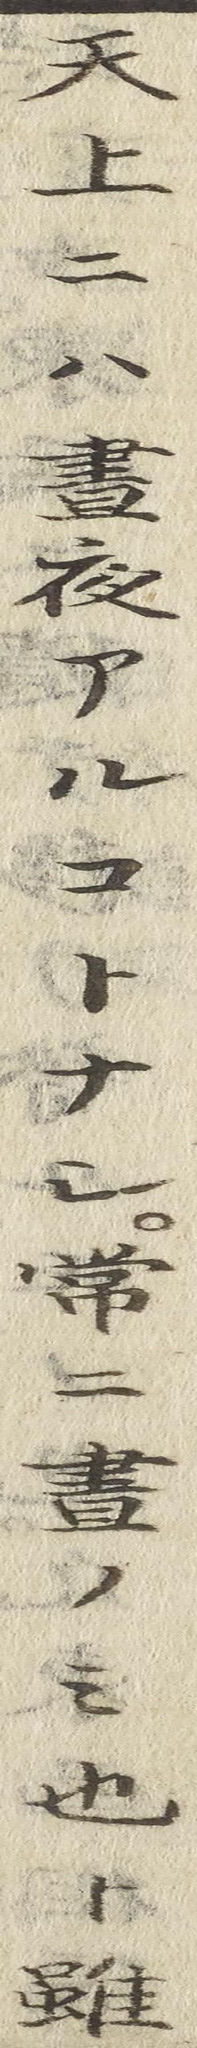天上ニハ昼夜アルコトナシ。常ニ昼ノミ也ト雖
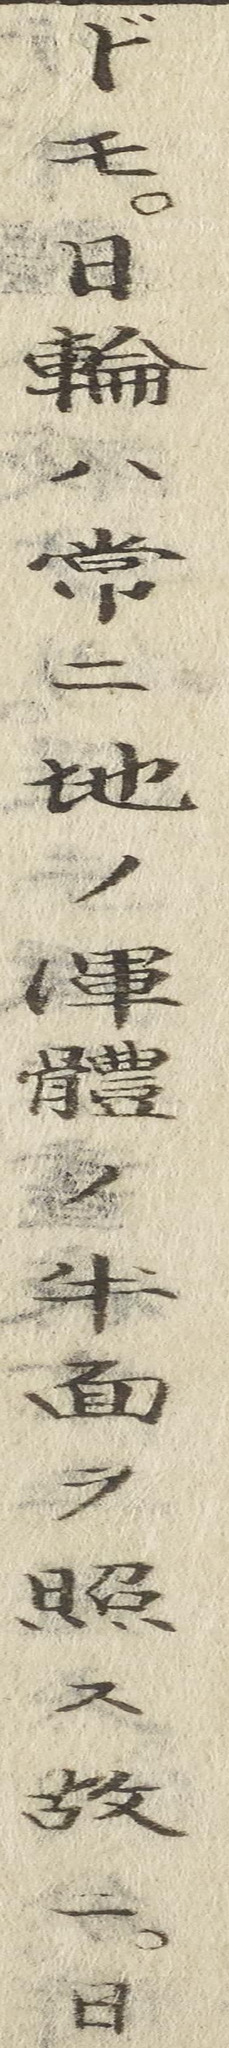ドモ。日輪ハ常ニ地ノ渾体ノ半面ヲ照ス故ニ。日
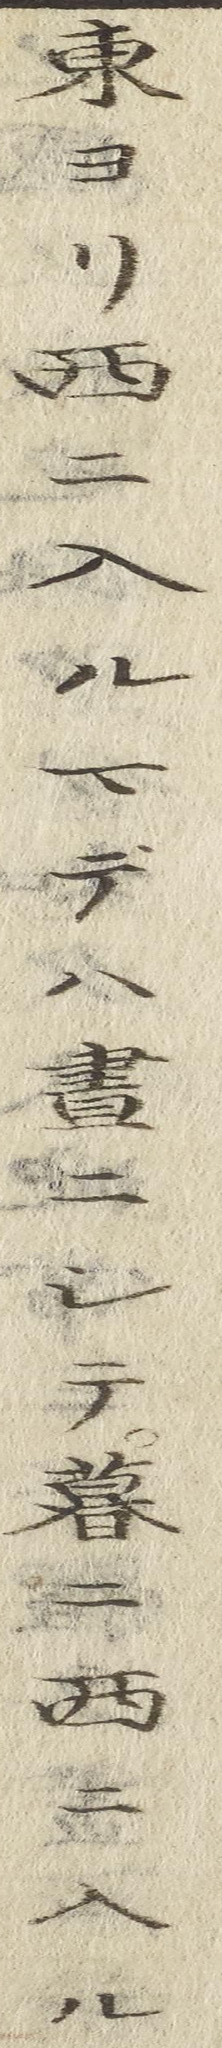東ヨリ西ニ入ルマデハ昼ニシテ。暮ニ西ニ入ル
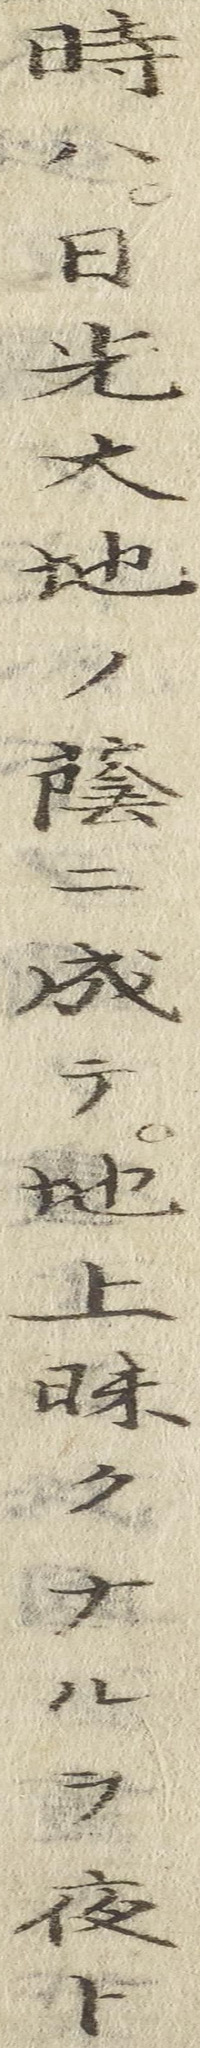時ハ。日光大地ノ蔭ニ成テ、地上昧クナルヲ夜ト

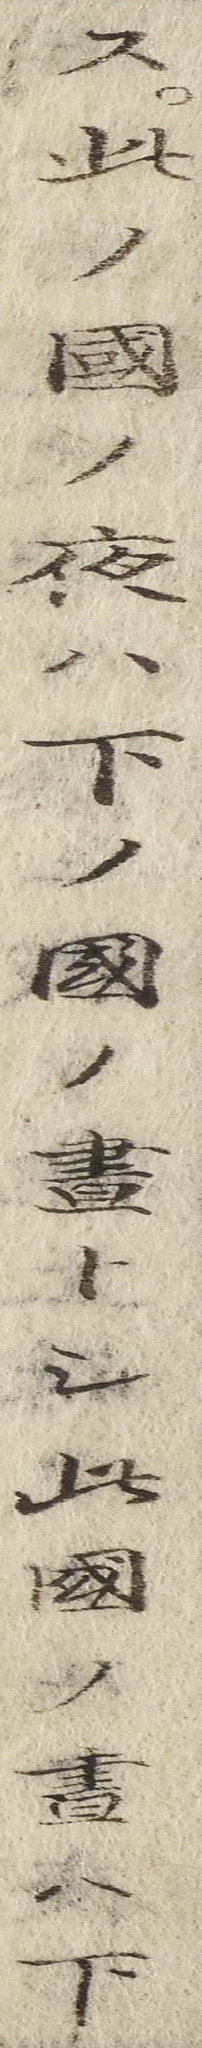ス。此ノ国ノ夜ハ下ノ国ノ昼トシ此国ノ昼ハ下
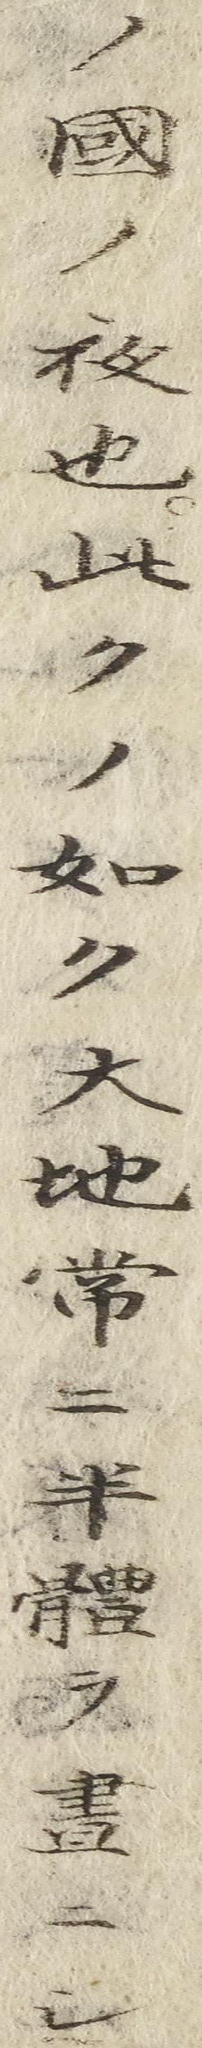ノ国ノ夜也。此クノ如ク大地常ニ半体ヲ昼ニシ
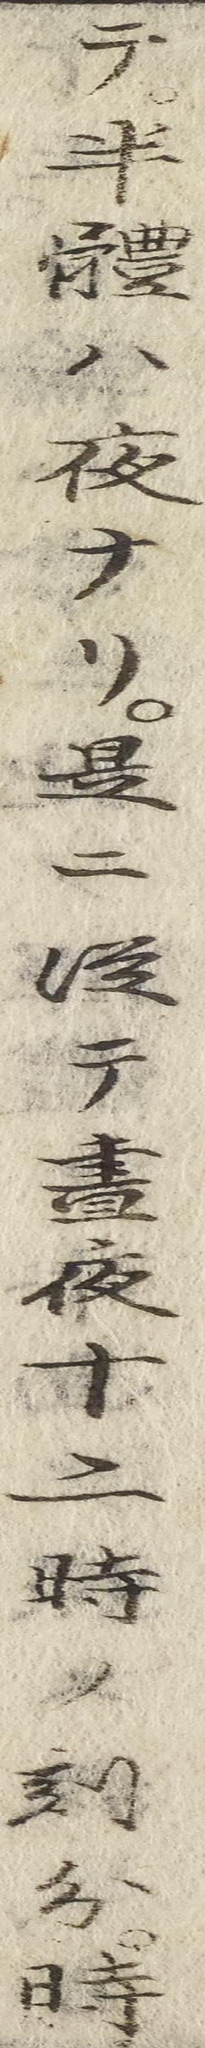テ。半体ハ夜ナリ。是ニ従テ昼夜十二時ノ刻分。時
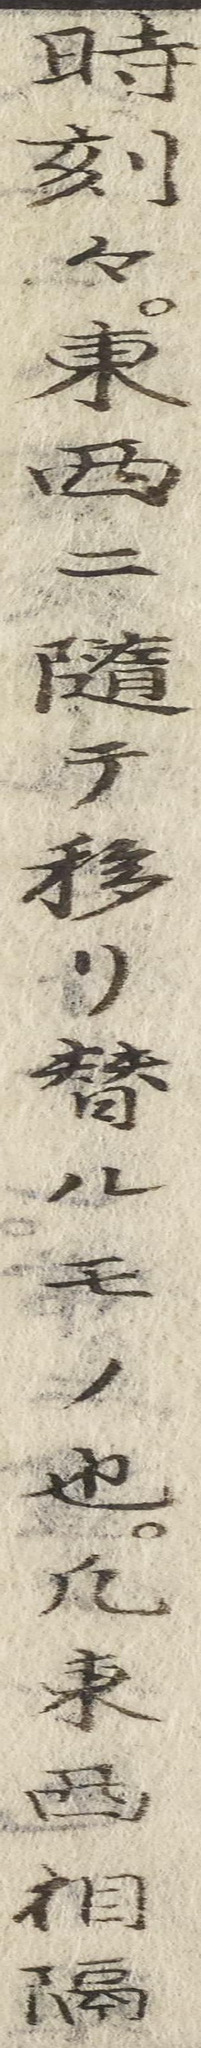時刻々。東西ニ随テ移リ替ルモノ也。凡東西相隔
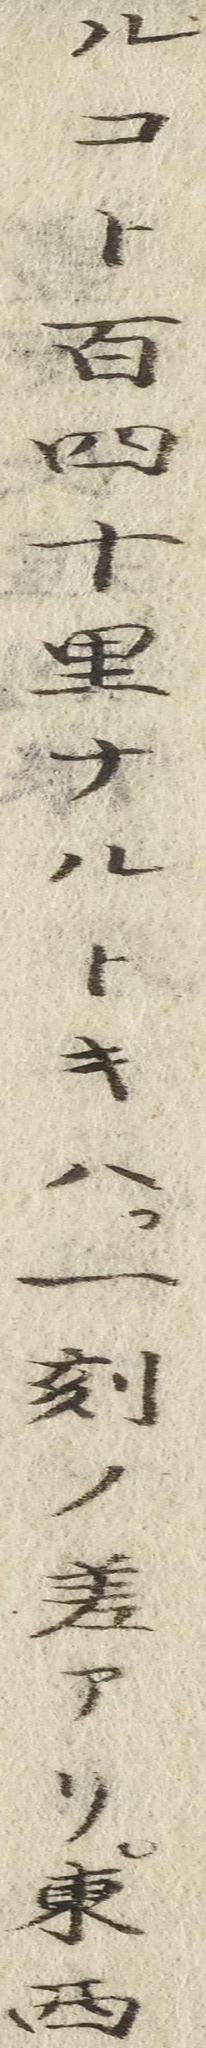ルコト百四十里ナルトキハ。一刻ノ差アリ。東西
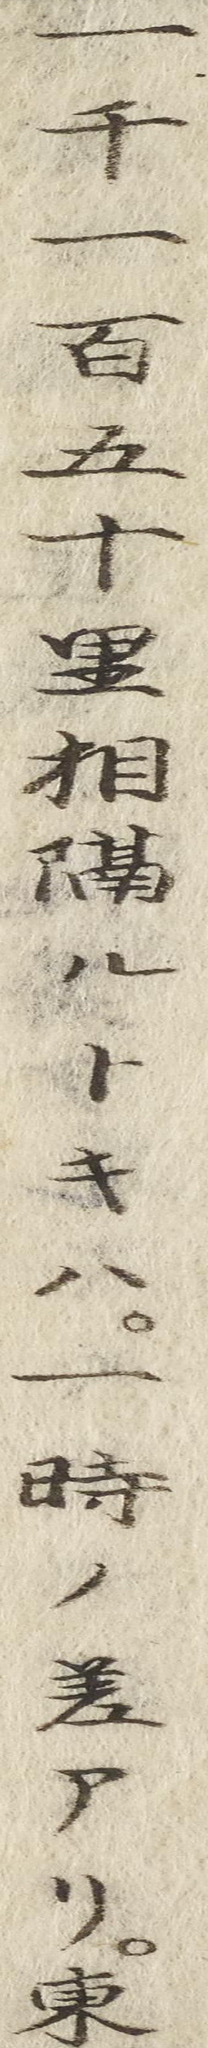一千一百五十里相隔ルトキハ。一時ノ差アリ。東
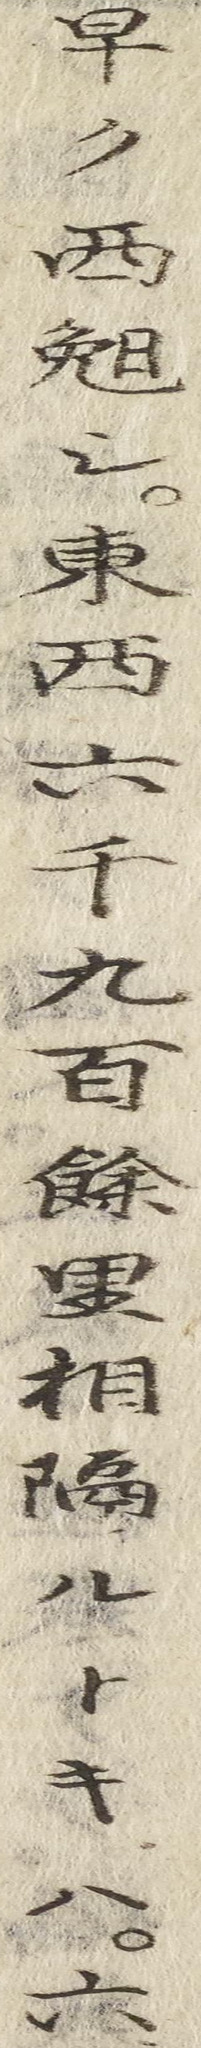早ク西晩シ。東西六千九百余里相隔ルトキハ。六
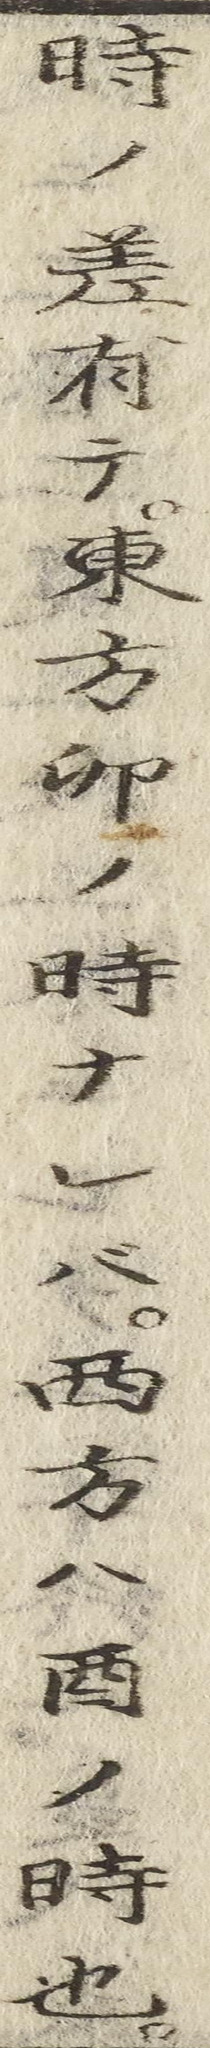時ノ差テ。東方卯ノ時ナレバ。西方ハ酉ノ時也。
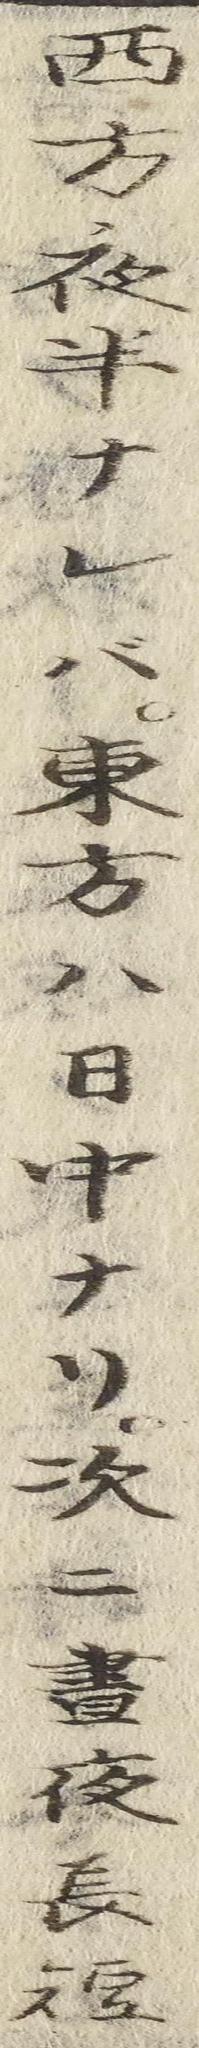西方夜半ナレバ。東方ハ日中ナリ。次ニ昼夜長短
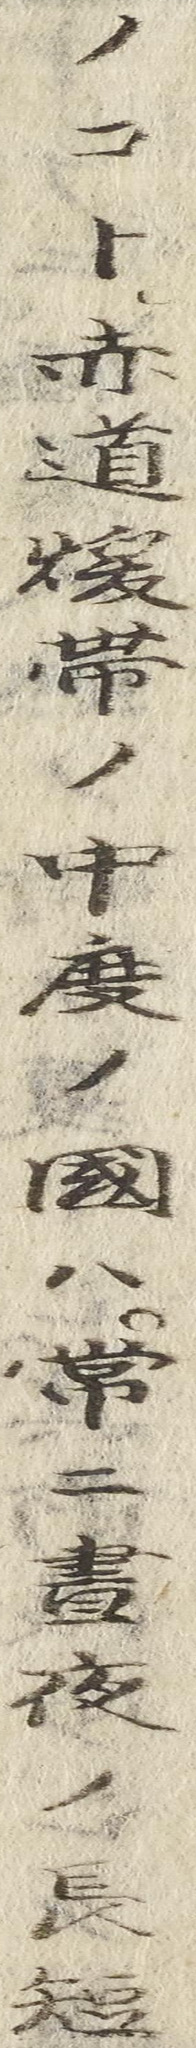ノコト。赤道煖帯ノ中度ノ国ハ。常ニ昼夜ノ長短
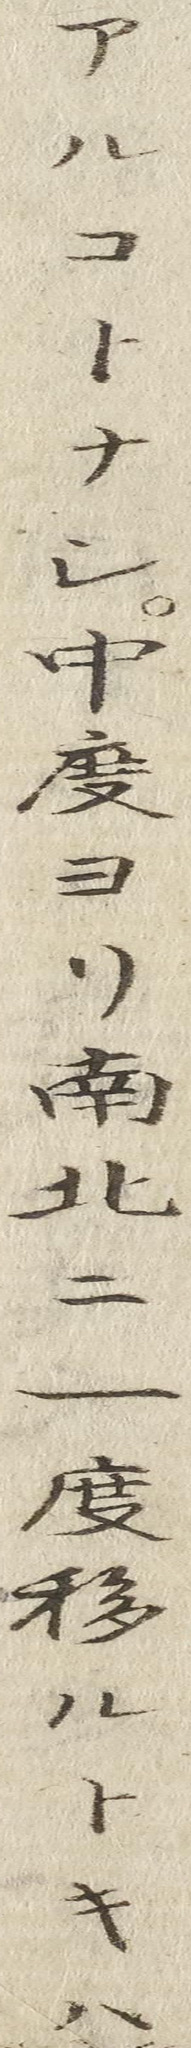アルコトナシ。中度ヨリ南北ニ一度移ルトキハ。
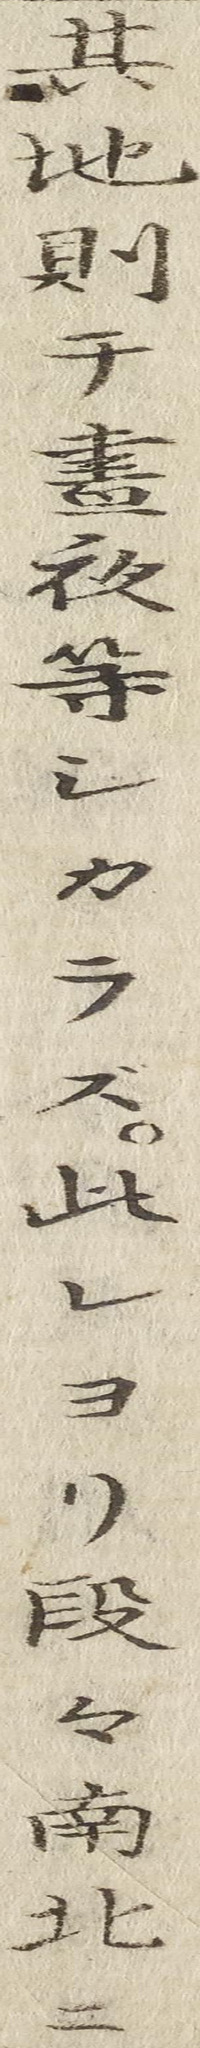其地即チ昼夜等シカラズ。此レヨリ段々南北ニ
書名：大略天学名目鈔　天經或問附録
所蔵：東京大学地震研究所図書室 Earthquake Research Institute Library, The University of Tokyo, JAPAN
